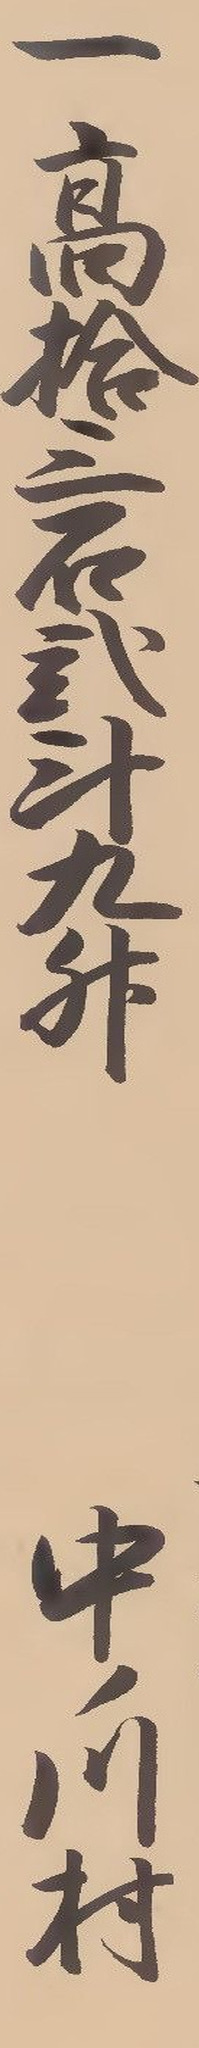一髙拾三石弐斗九升中ノ川村
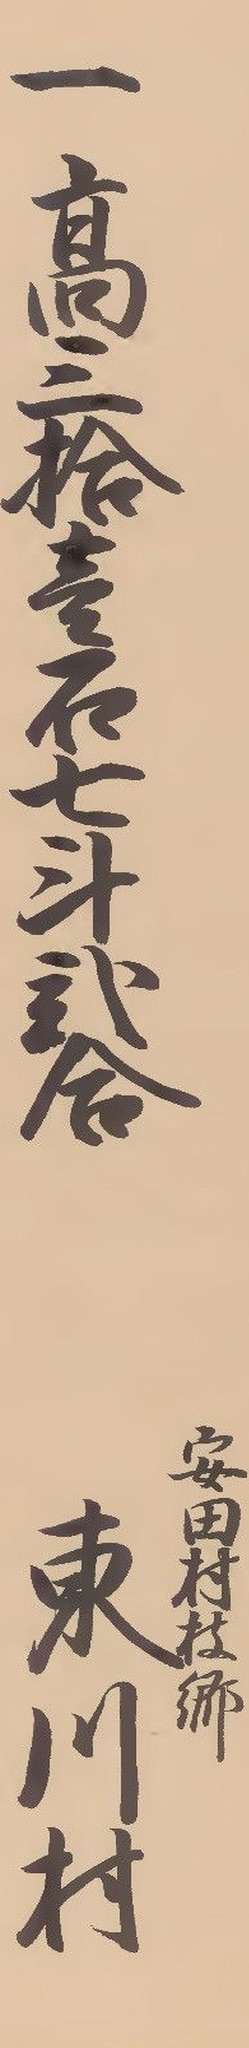一髙三拾壱石七斗弐合東川村
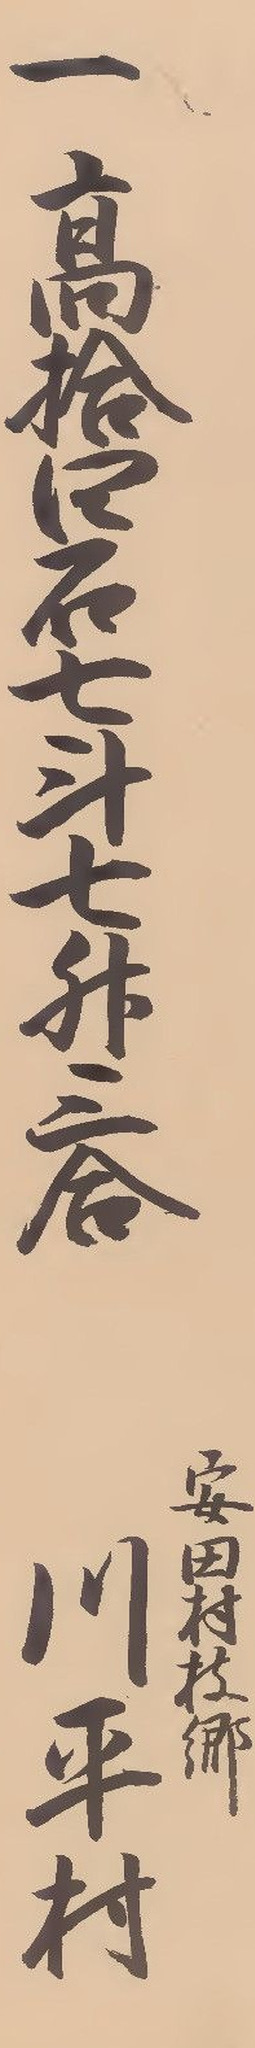一髙拾四石七斗七升三合川平村

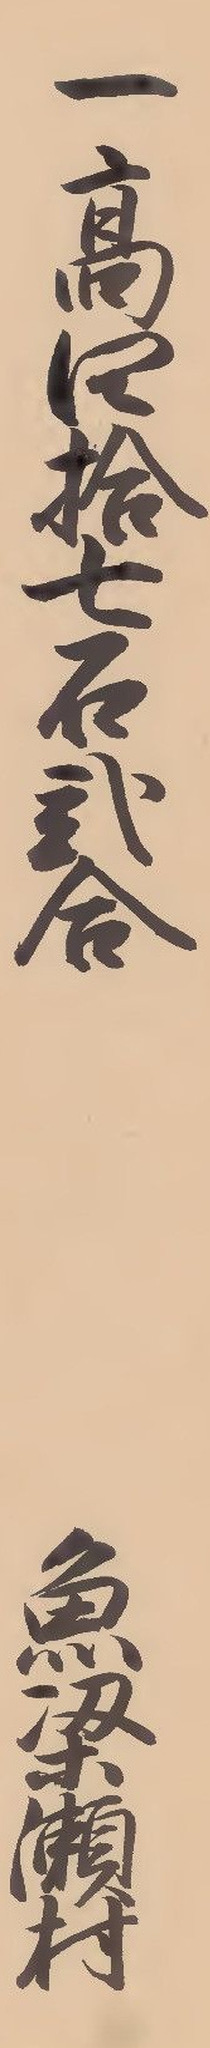一髙四拾七石弐合魚梁瀬村
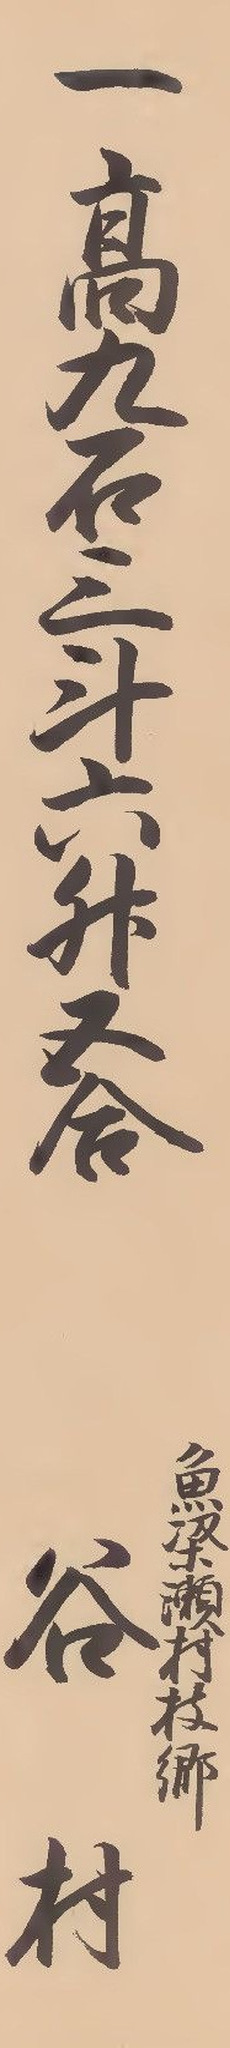一髙九石三斗六升五合谷村
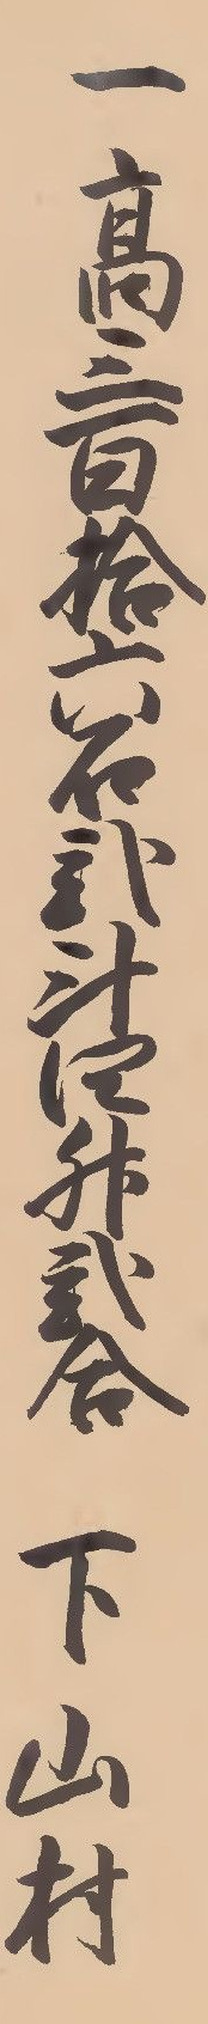一髙三百拾六石弐斗四升弐合下山村
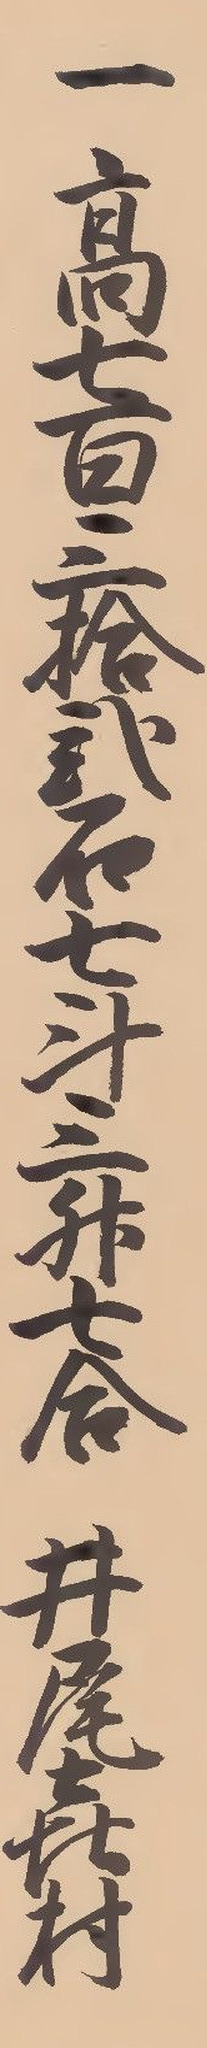一髙七百三拾弐石七斗三升七合井尾喜村
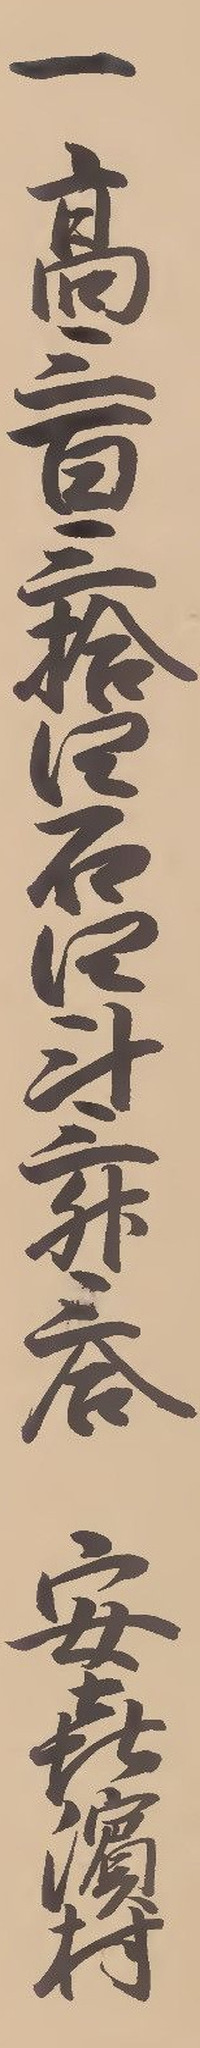一髙三百三拾四石四斗三升三合安喜濱村
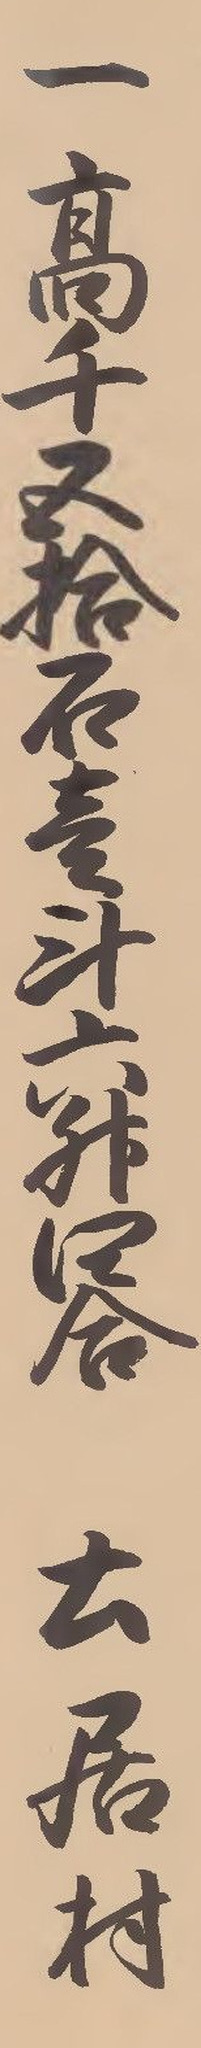一髙千五拾石壱斗六升四合土居村
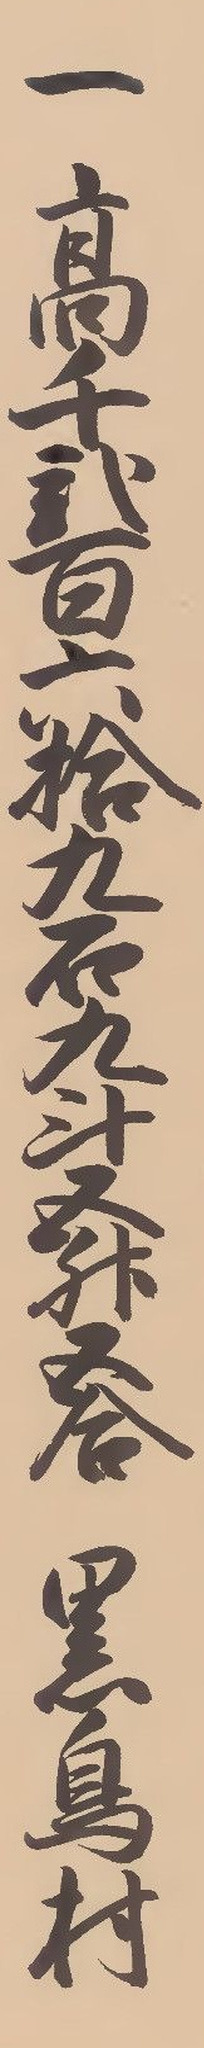一髙千弐百六拾九石九斗五升五合黑鳥村
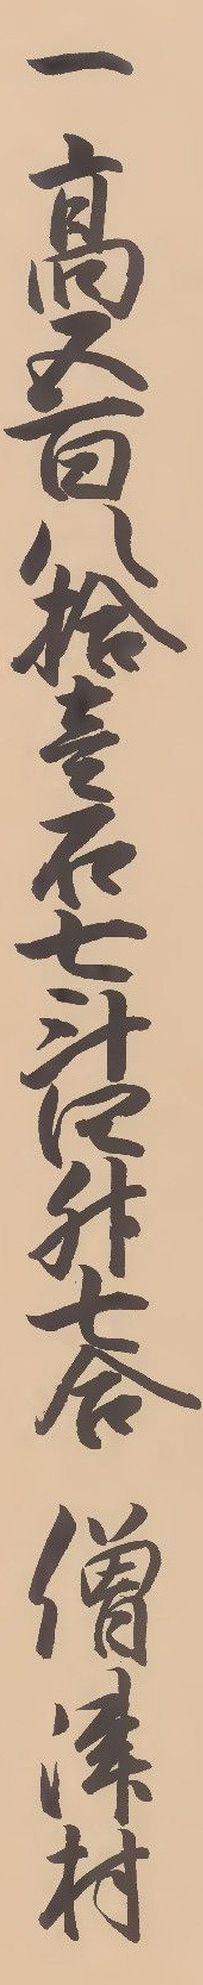一髙五百八拾壱石七斗四升七合僧津村

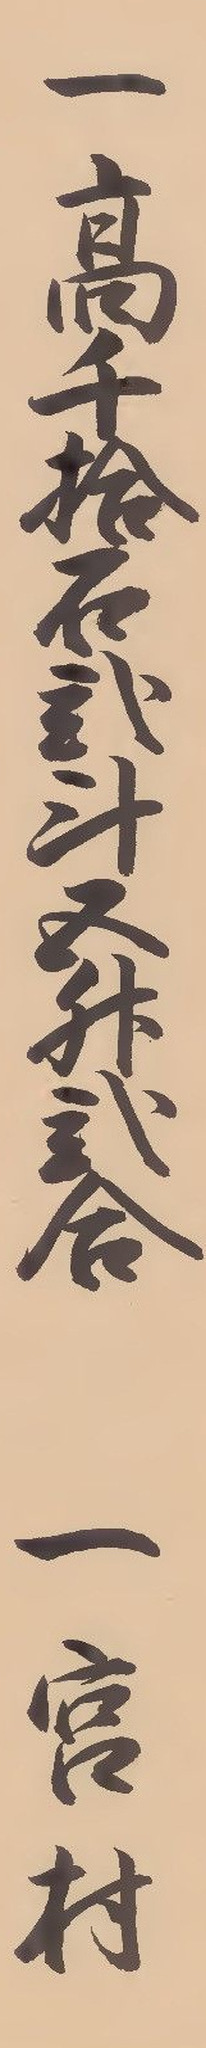一髙千拾石弐斗五升弐合一宮村
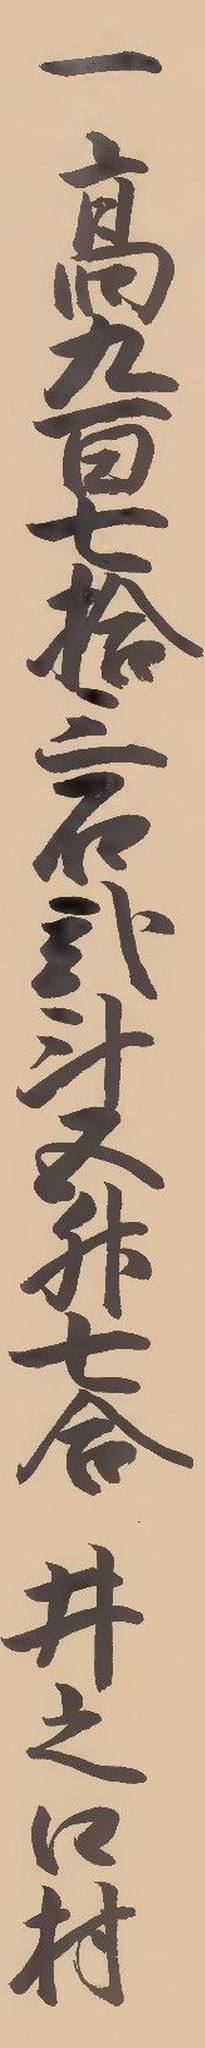一髙九百七拾三石弐斗五升七合井之口村
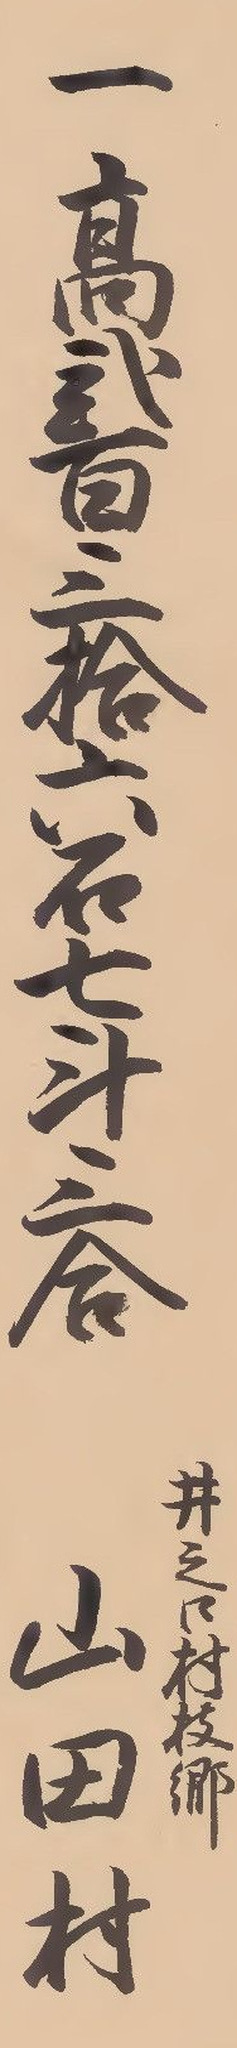一髙弐百三拾六石七斗三合山田村
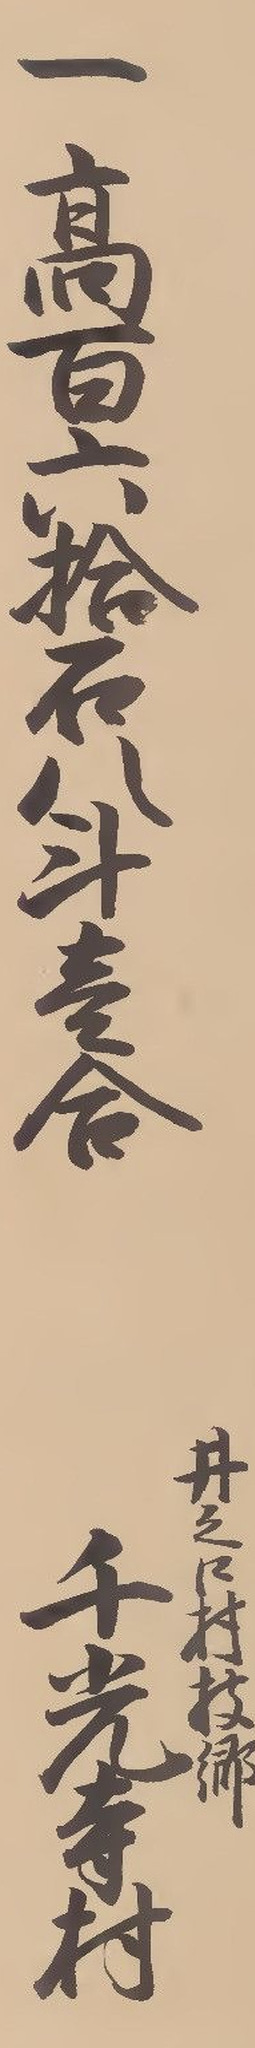一髙百六拾石八斗壱合千光寺村
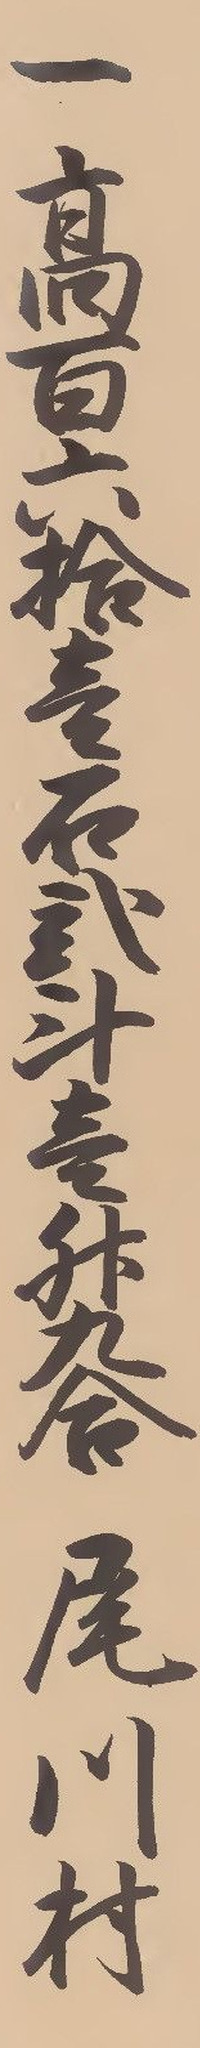一髙百六拾壱石弐斗壱升九合尾川村
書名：土佐国郷帳
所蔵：国立公文書館 National Archives of Japan
